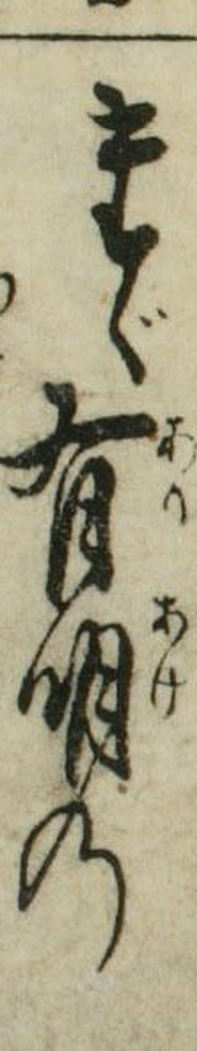たゞ有明の
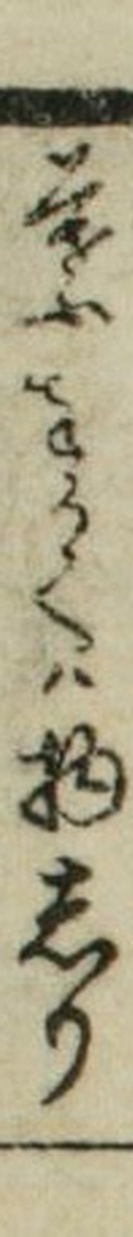葉をかくは物しり
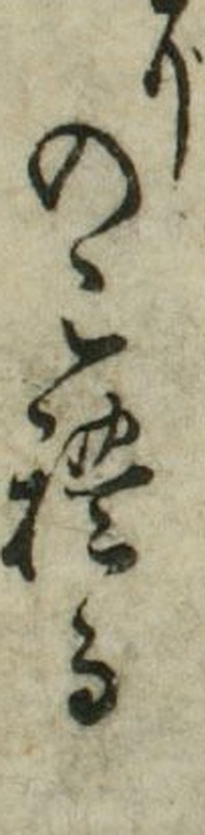のこれる

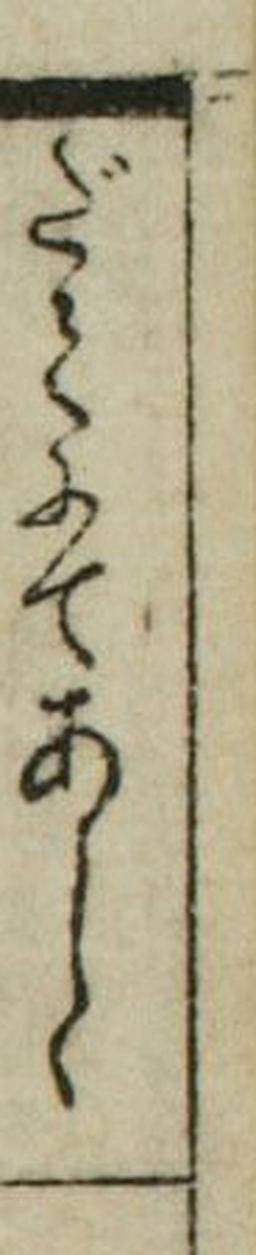だてにてあしく
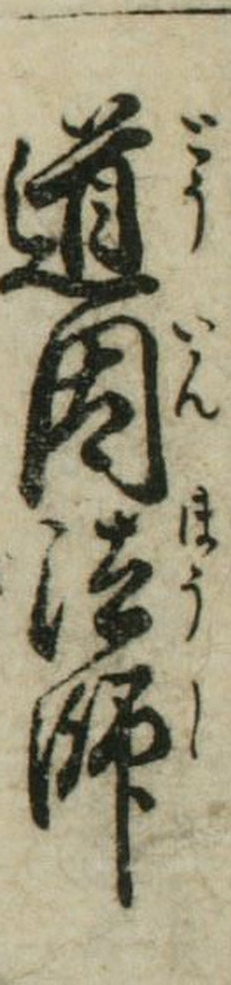道因法師
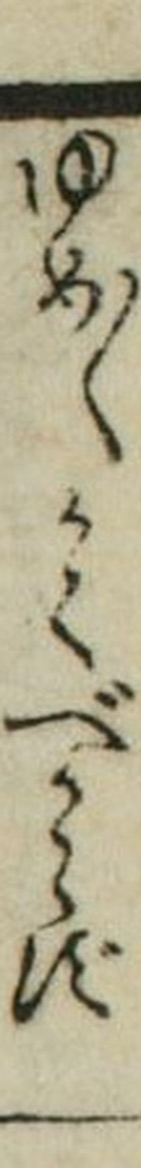ゆめ〳〵かくべからず
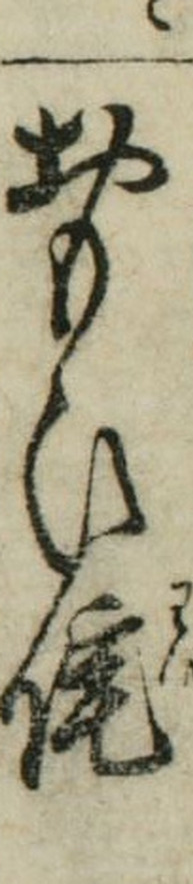おもひ侘
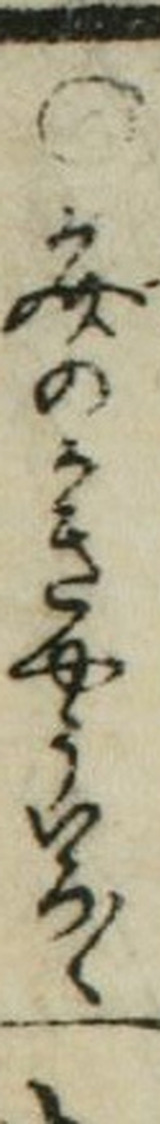○文のかきやういろ〳〵
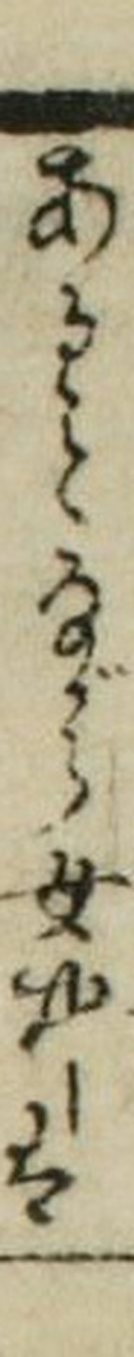あることながら女中は
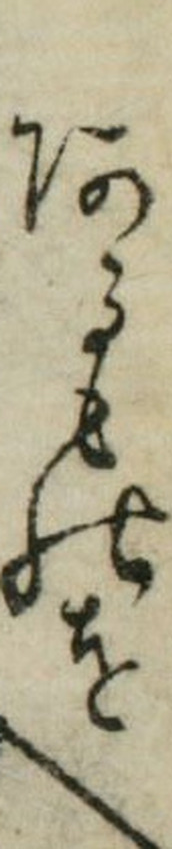あるものを
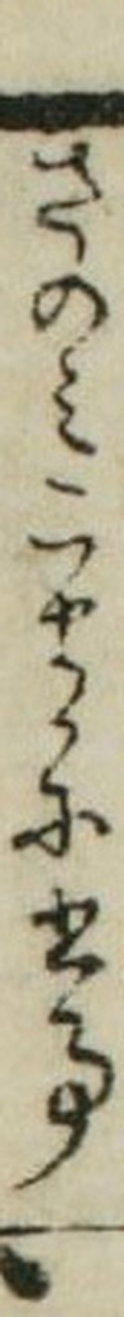さのみこまかに書事
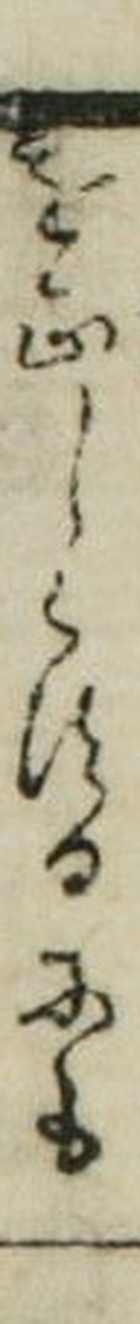を正しくするにも
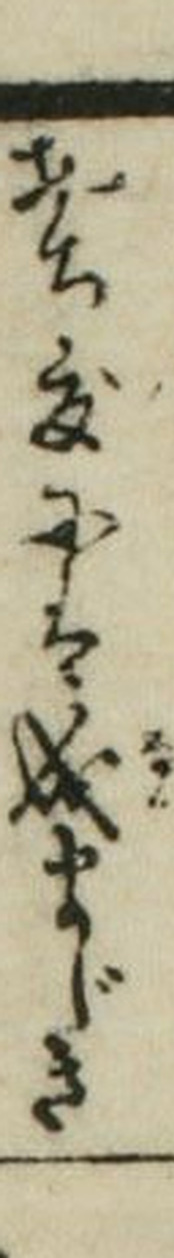おち度には成まじき
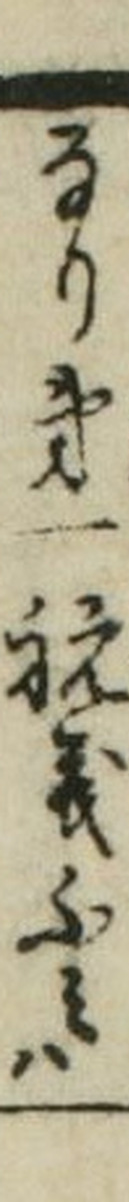なり第一祝義ふみは
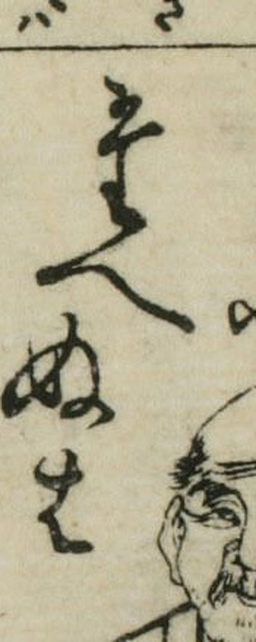たへぬは
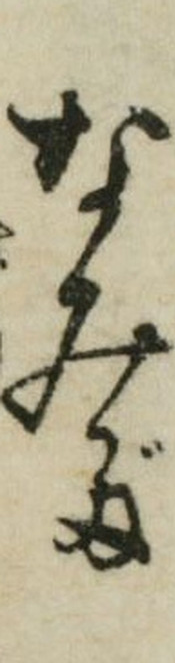なみだ
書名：百人一首
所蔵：東京学芸大学教育コンテンツアーカイブ
